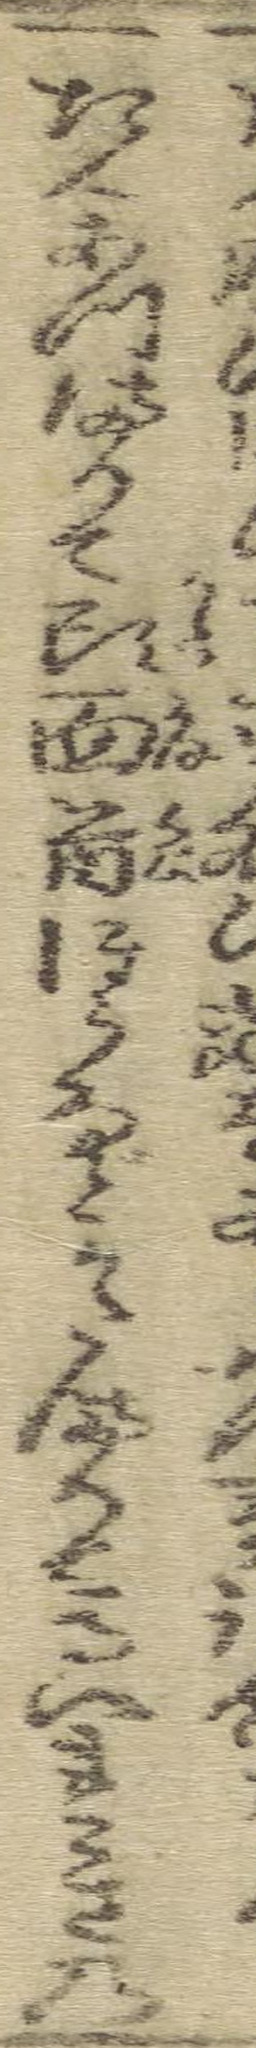一たんあつまりて頭面首ほうなどかたまりてるいれきの
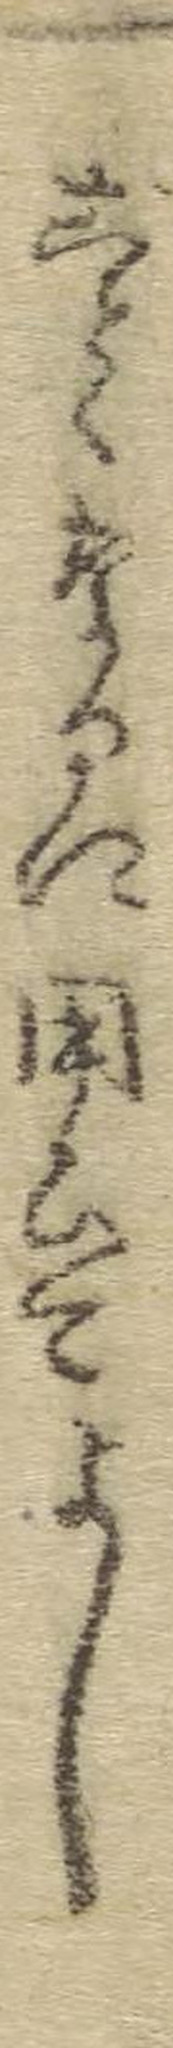ごとくになるに用ひてよし
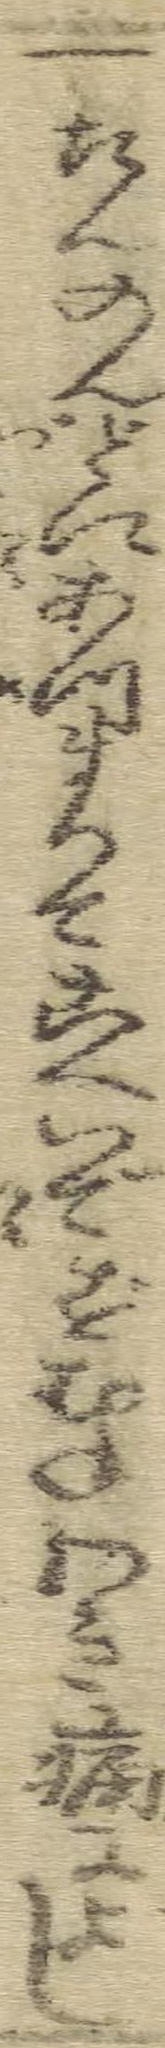一たんのんどにあつまりてこへいでずむねわき痛によし
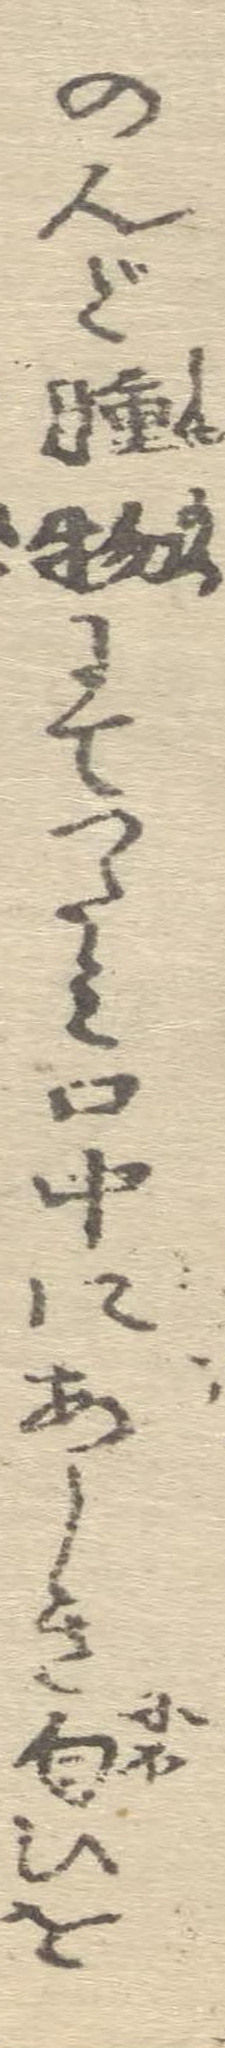のんど腫物にていたみ口中にあしき匂ひを
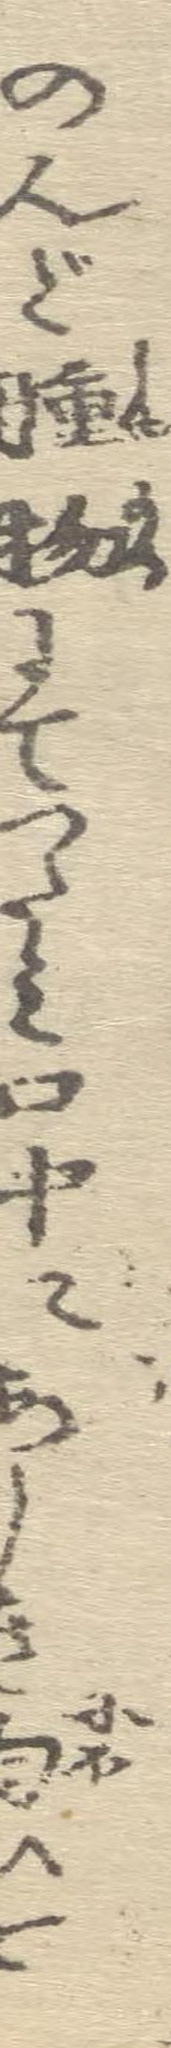のんど腫物にていたみ口中にあしき匂ひを
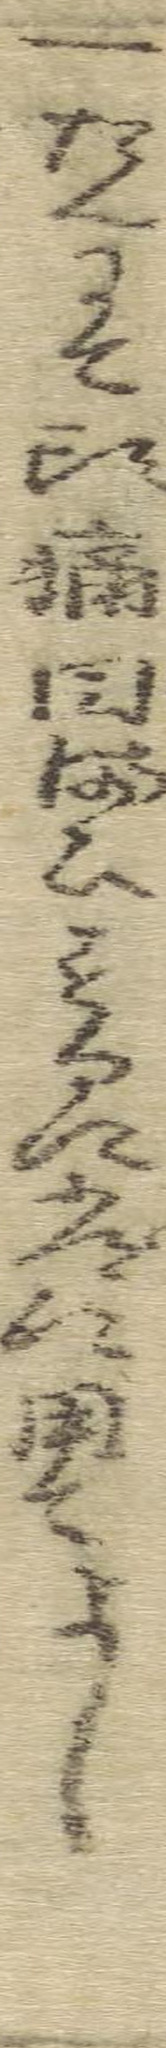一たんにて頭痛目まひするに常に用てよし
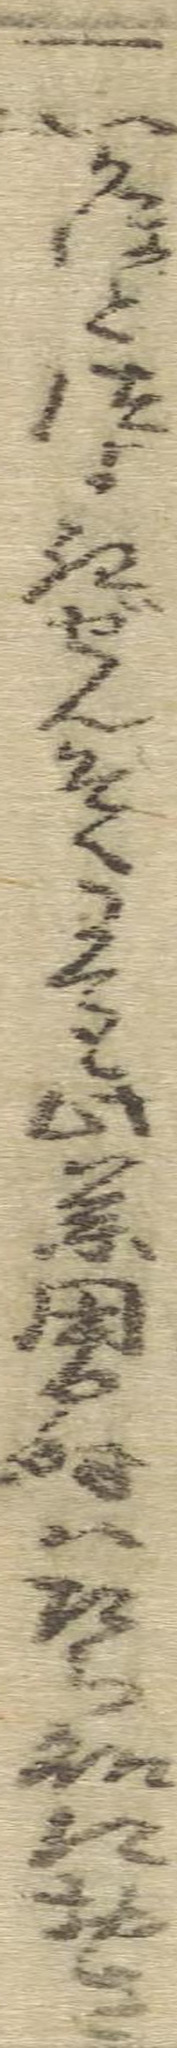一いかほとつよきぜんそくにても此薬用る時はたち処におさ
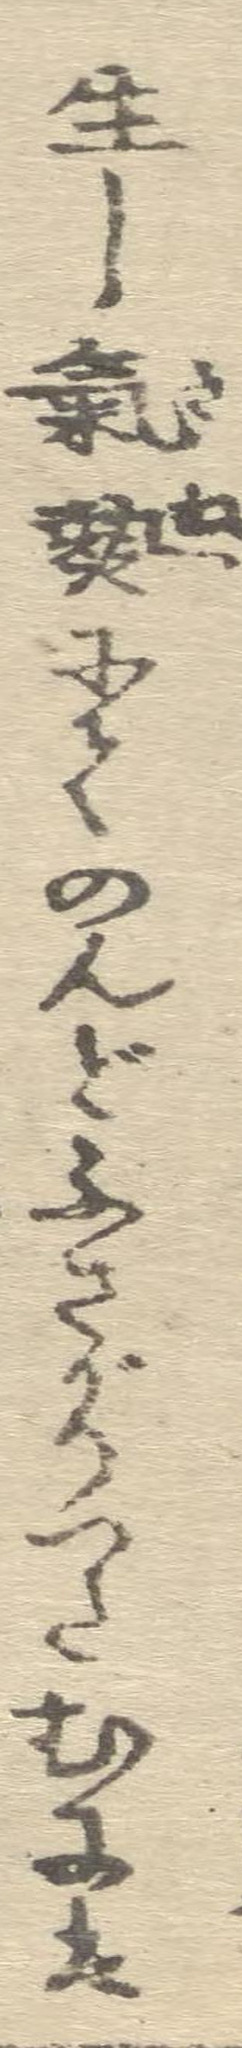生し気熱にてのんどふさがりいたむには
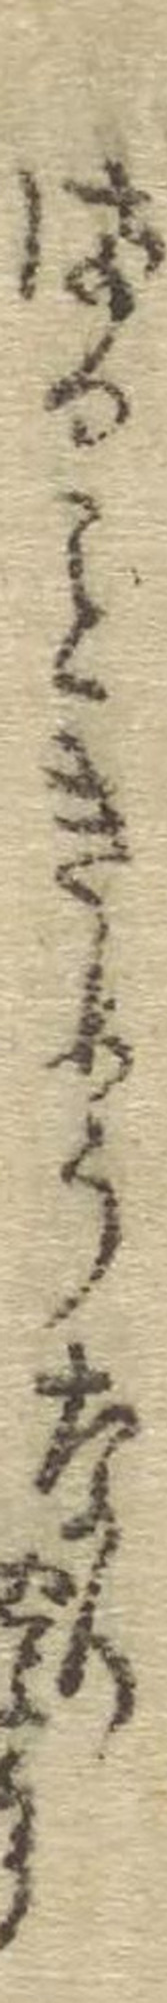まることきめうなり
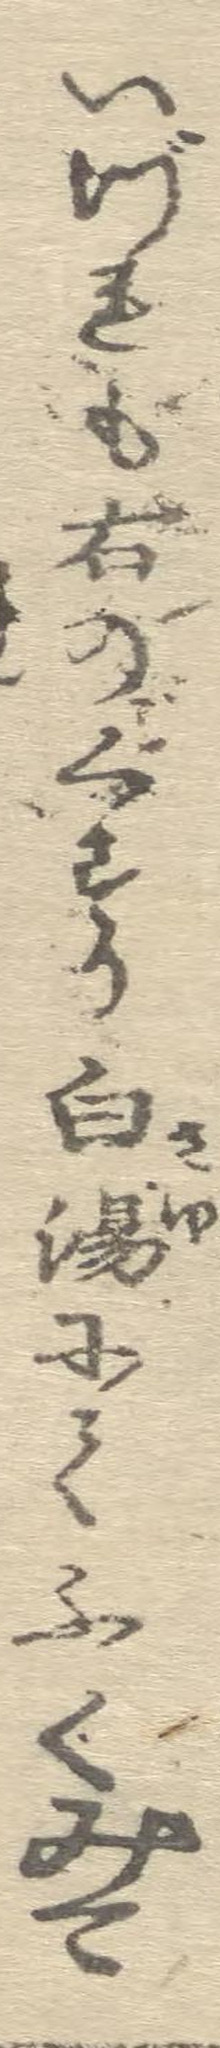いづれも右のくすり白湯にてふくみて
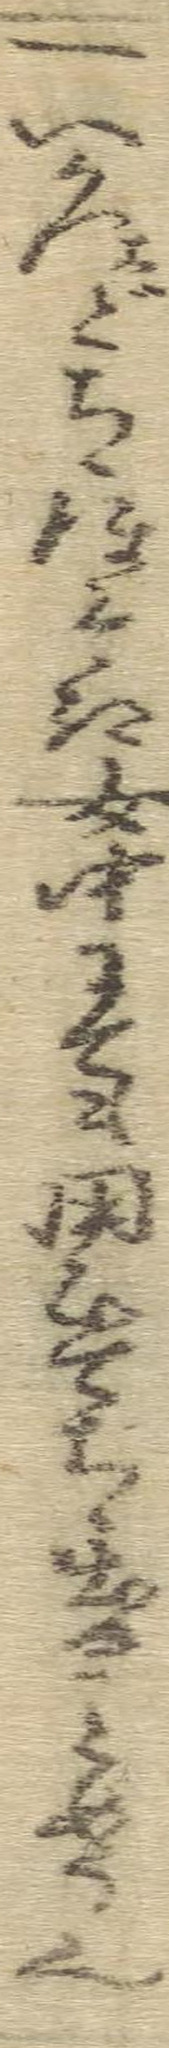一いかほどちゝほそき女中にても用ひてちゝ出ることめう也
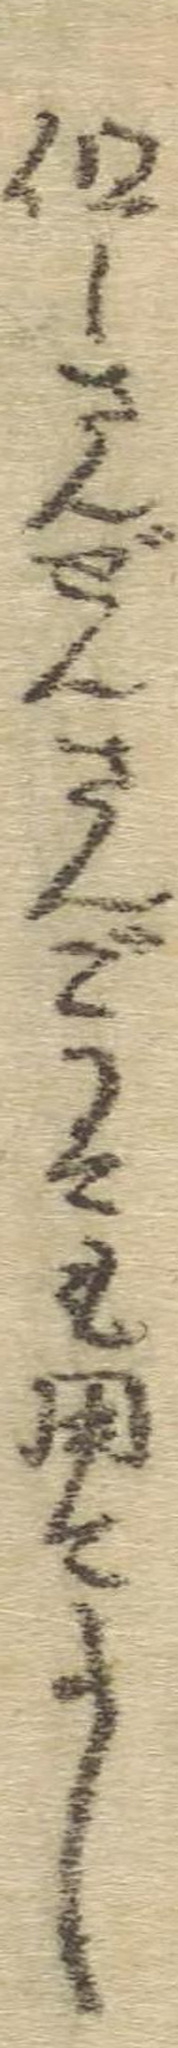但しさんぜんさんごにても用てよし
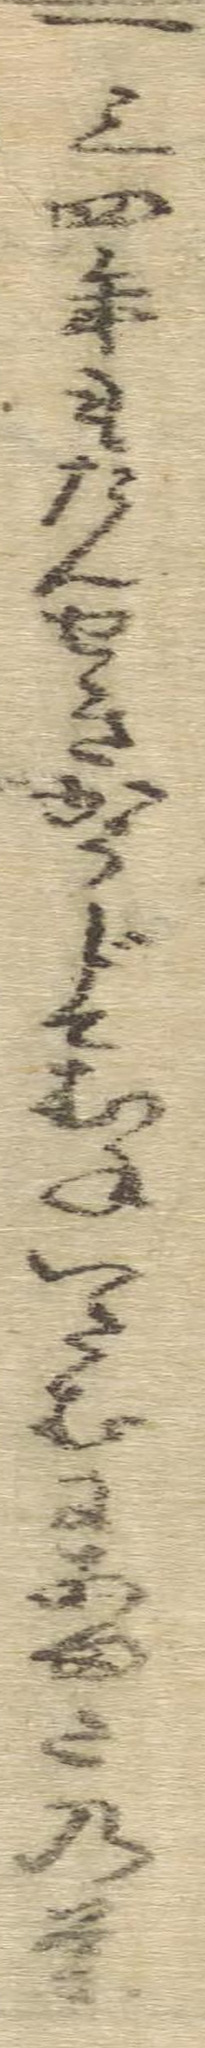一三四年もたんせきかうじてむねいたむにあまたの薬
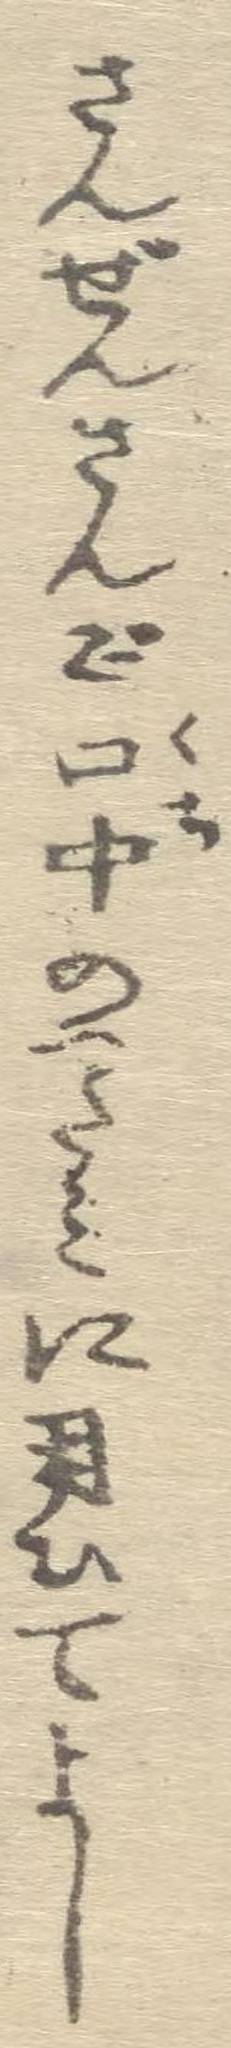さんぜんさんご口中のいたみに用ひてよし
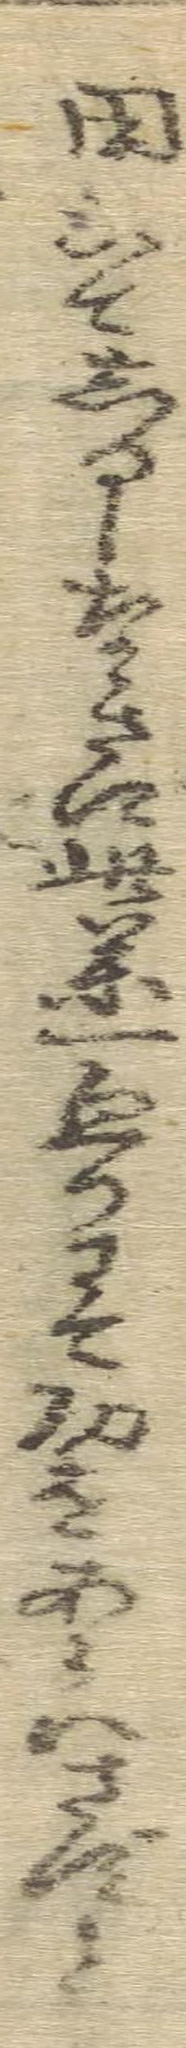用ひてしるしなきに此薬一廻にて功をあらはさずと
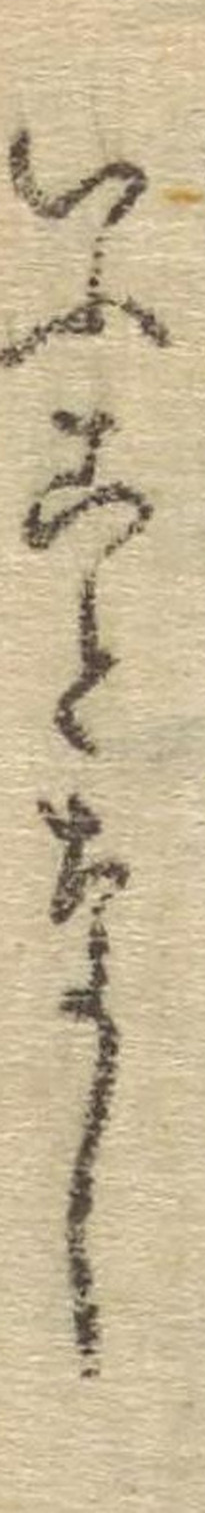いふことなし
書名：浪華薬種問屋能書張交帖. 二
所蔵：国立国会図書館 National Diet Library, JAPAN
